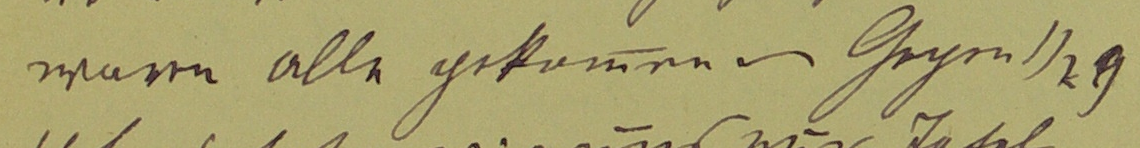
waren alle gekomen. Gegen 1/2 9
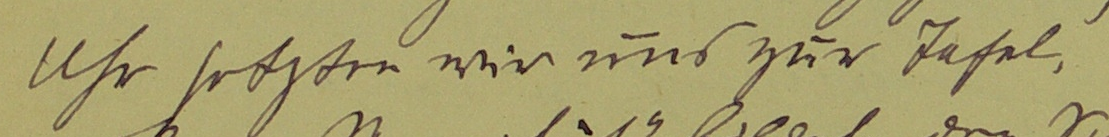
Uhr setzten wir uns zur Tafel.
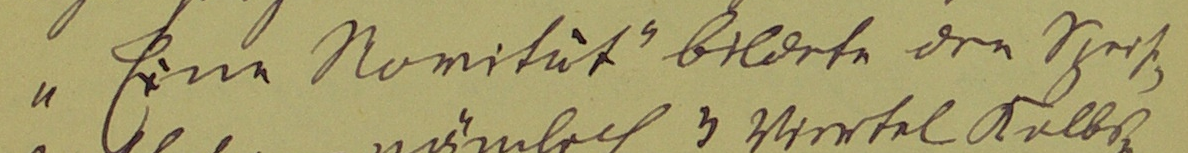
„ Eine Nowität“ bildete den Speise¬
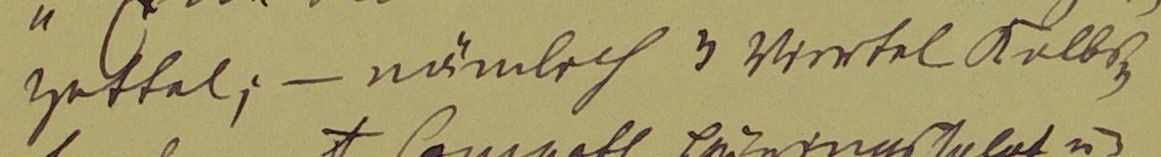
zettel; - nämlich 3 Viertel Kalbs¬
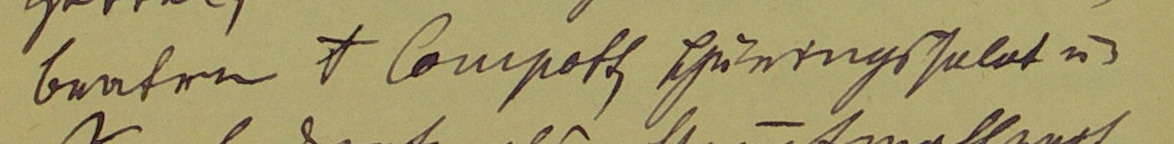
braten t Compott, Heringssalat u.
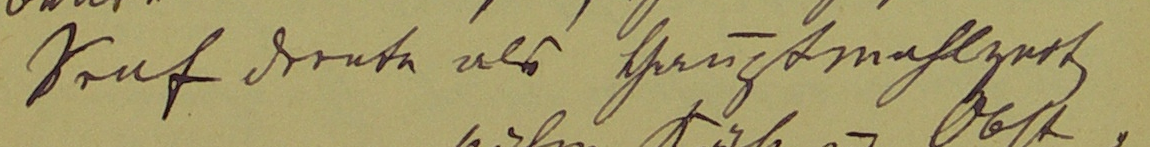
Senf diente als Hauptmalzeit,
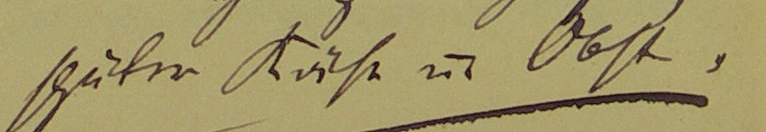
später Käse und Obst
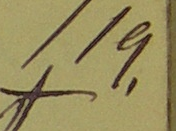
119
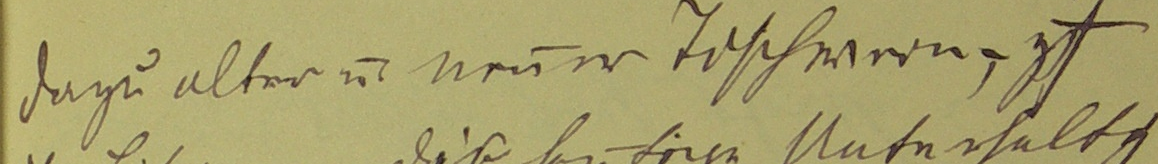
dazu alter und neuer Tischwein,- zs
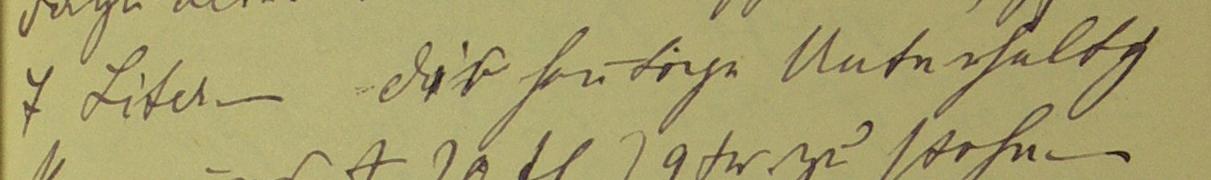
7 Liter. - Die heutige Unterhaltung
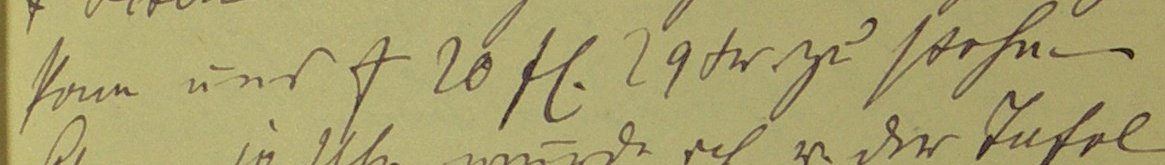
kam uns t 20 Fl. 29 tw zu stehen. -
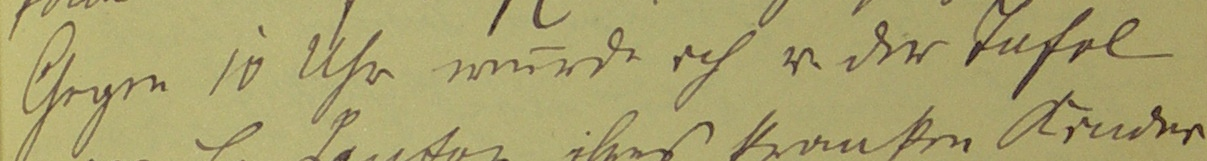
Gegen 10 Uhr wurde ich v. der Tafel
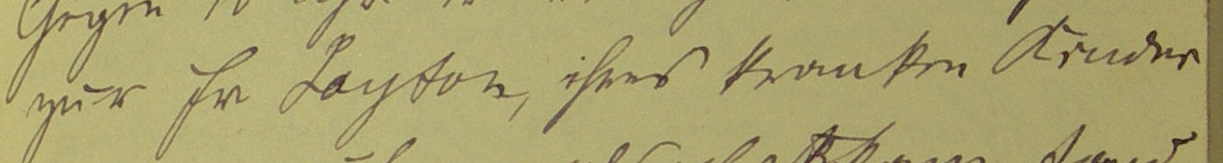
zur Fr. Layton, ihres kranken Kindes
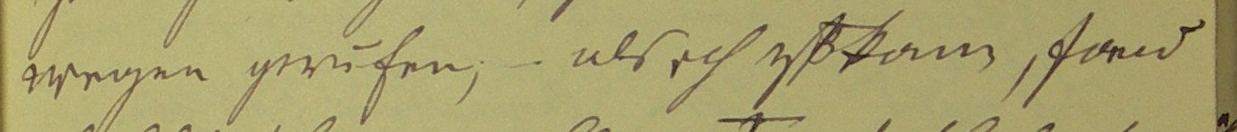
wegen gerufen, als ich ztkam, fand
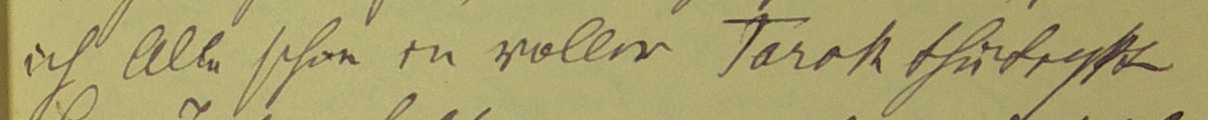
ich Alle schon in voller Tarokthätigkeit.
